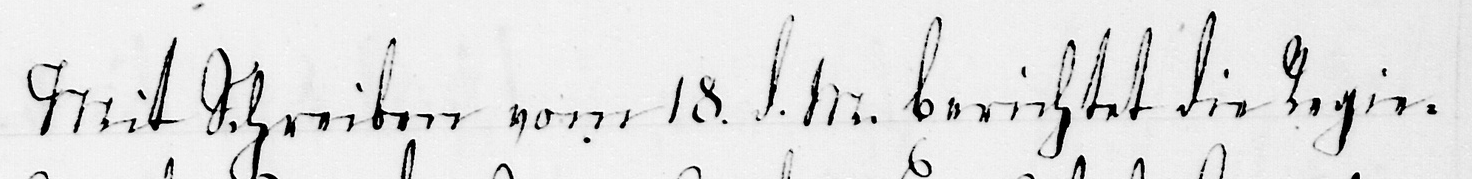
Mit Schreiben vom 18. d. M. berichtet die Regie¬
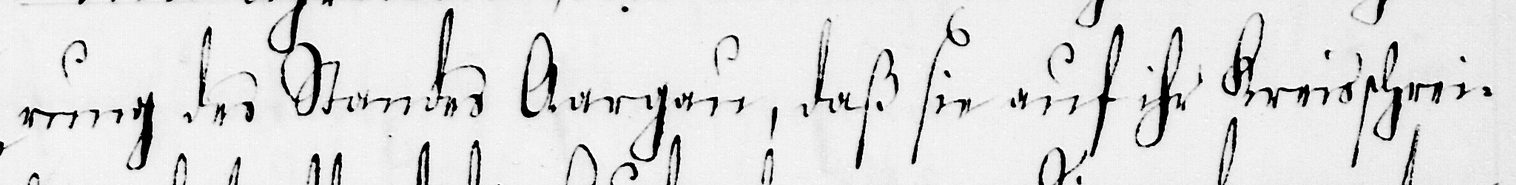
rung des Standes Aargau, daß sie auf ihr Kreisschrei¬
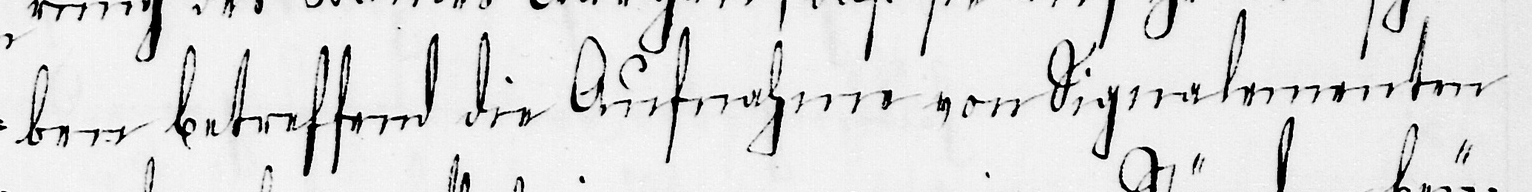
ben betreffend die Aufnahme von Signalementen
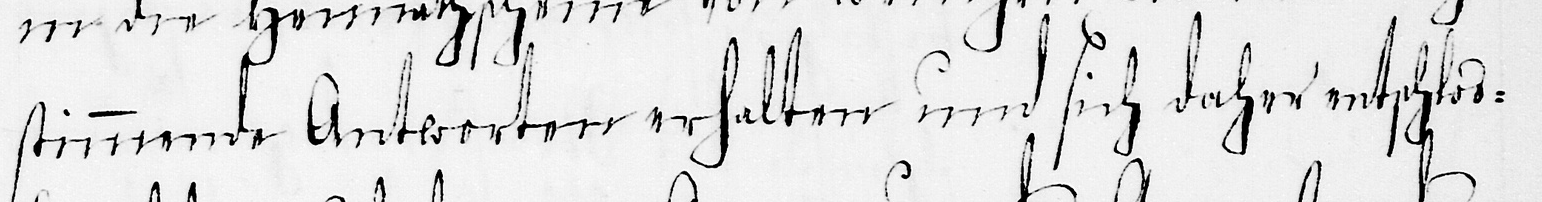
timmende Antworten erhalten und sich daher entschloß¬
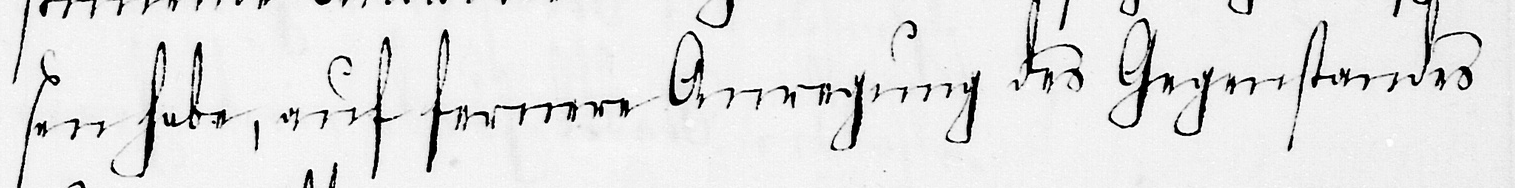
en habe, auf fernere Anregung des Gegenstandes
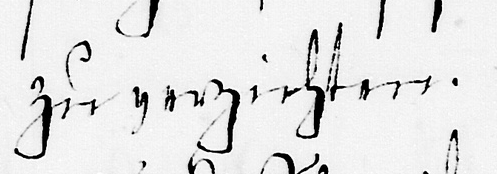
zu verzichten.
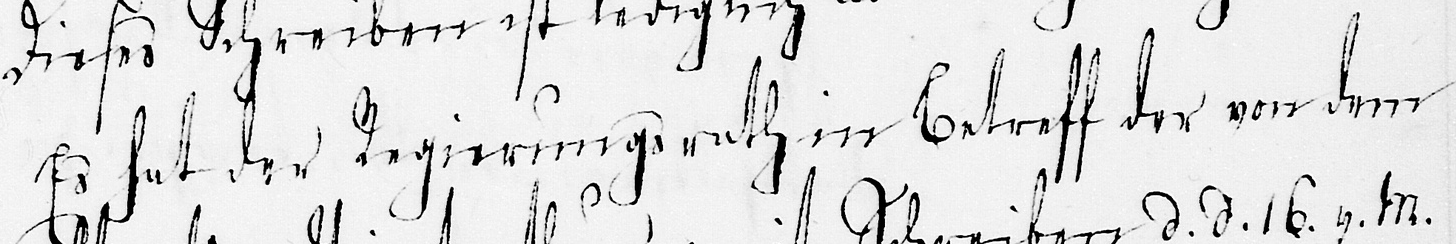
Es hat der Regierungsrath in Betreff der von dem
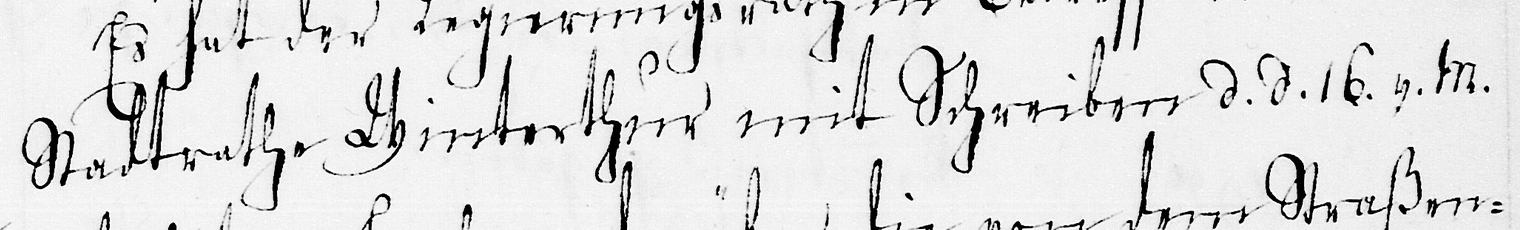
Stadtrathe Winterthur mit Schreiben d. d. 16. v. M.
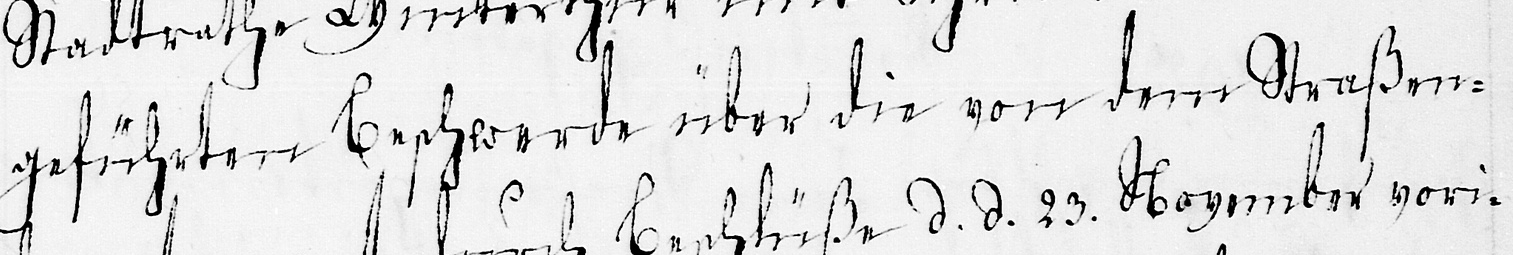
geführten Beschwerde über die von dem Straßen¬
